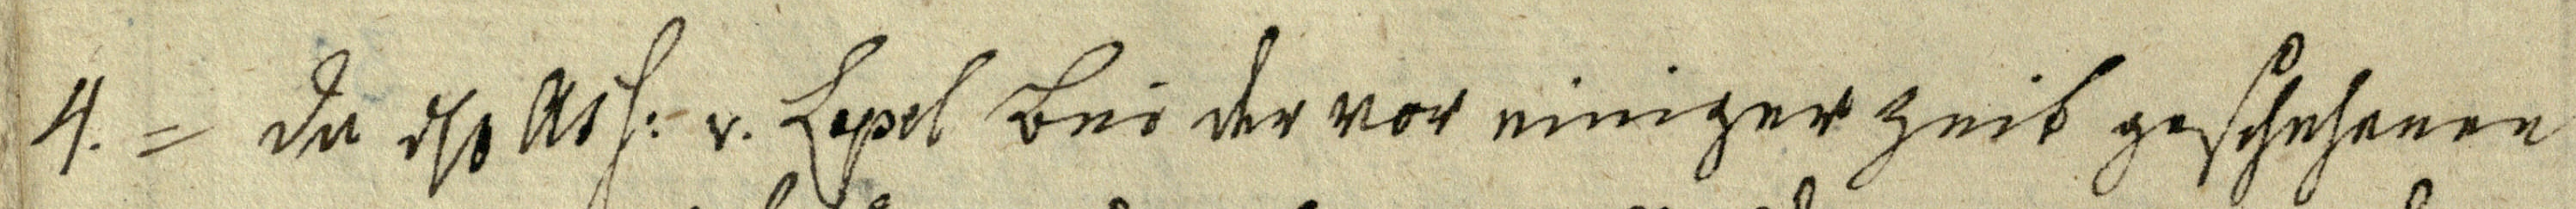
4. Da dh. Ass. v. Lepel bei der vor einiger Zeit geschehenen
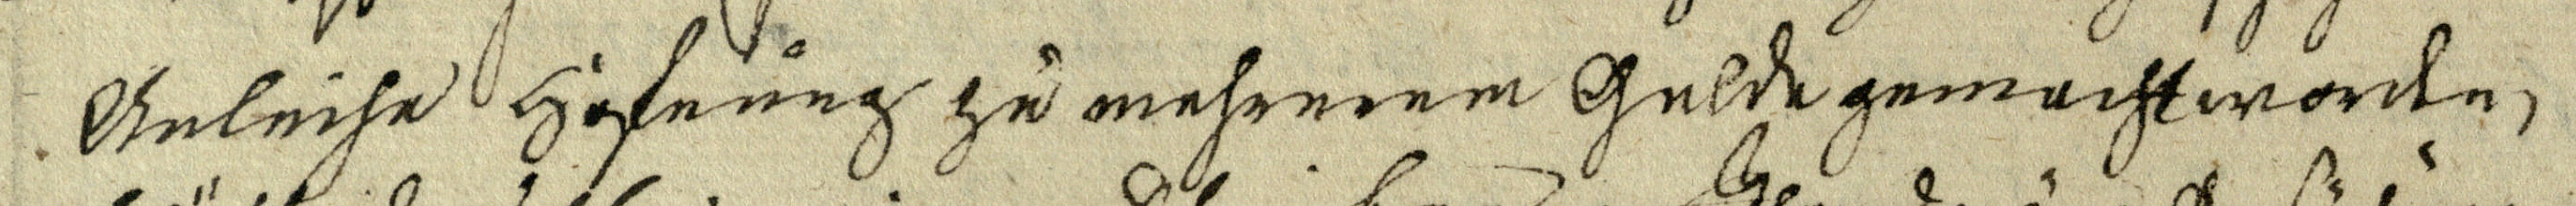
Anleihe Hofnung zu mehrerem Gelde gemacht worden,
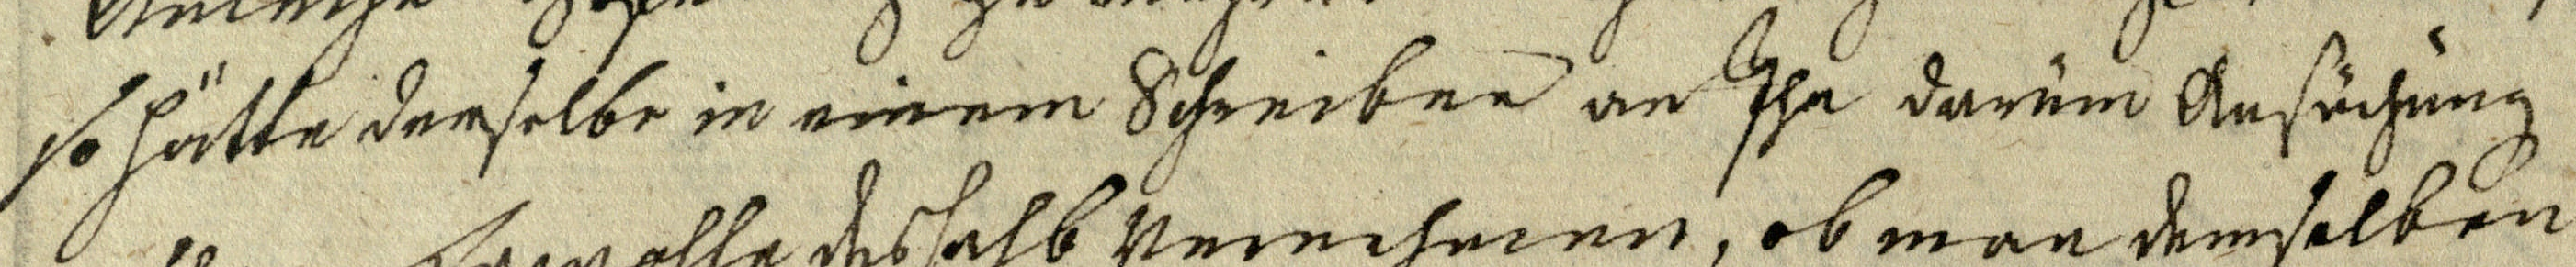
so hätte derselbe in einem Schreiben an Ihn darum Ansuchung
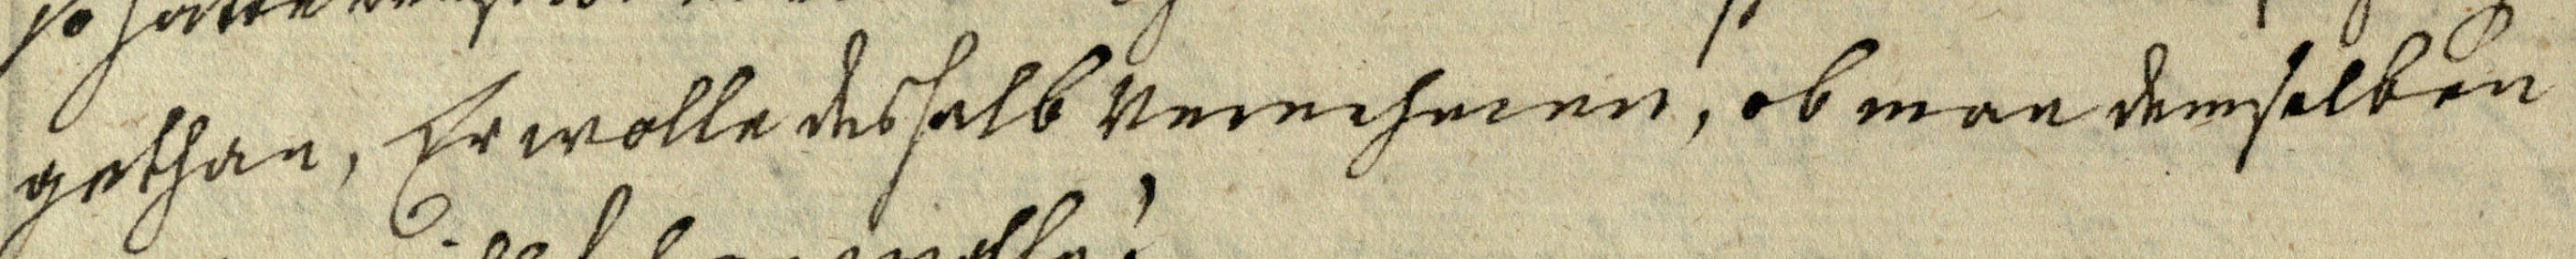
gethan, Er wolle deshalb vernehmen, ob man demselben
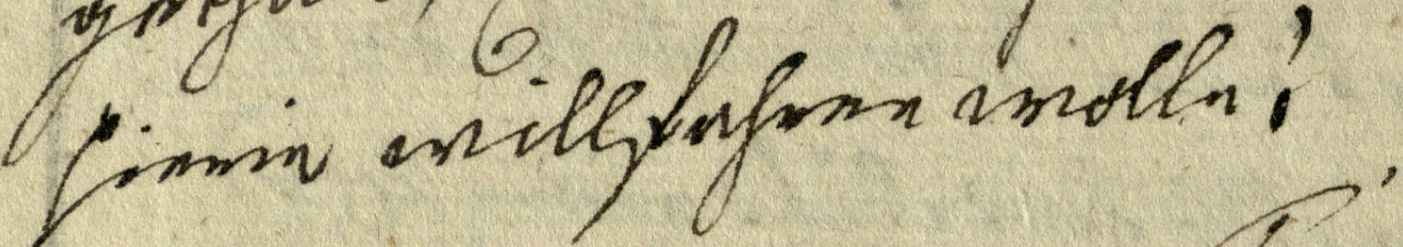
hierin willfahren wolle?
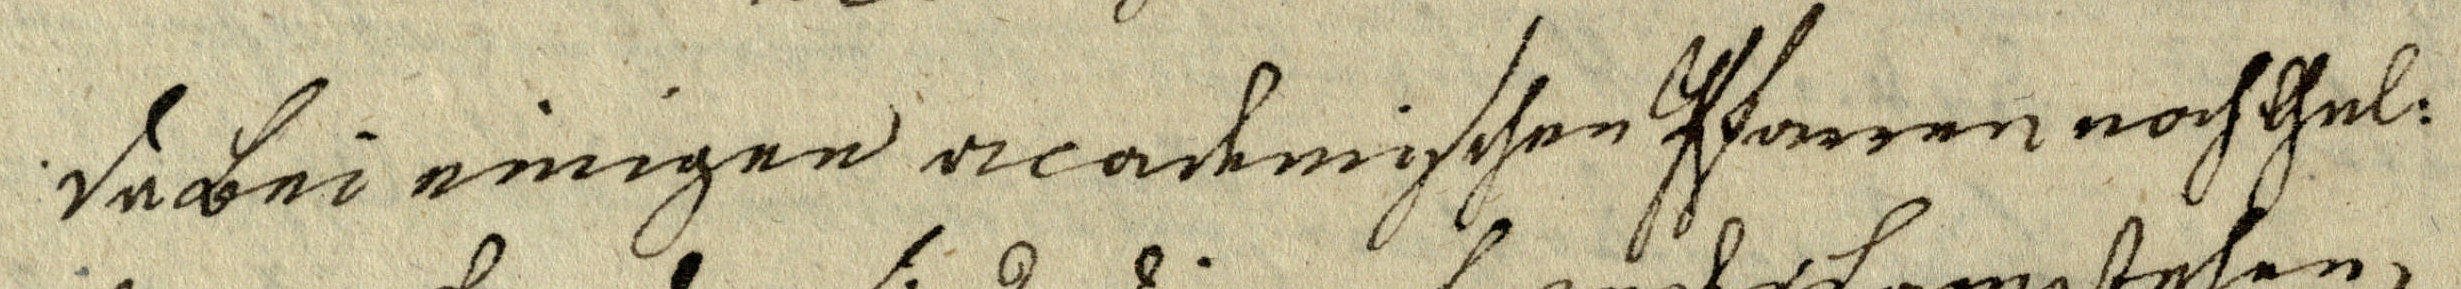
da bei einigen academischen Pfarren noch Gel¬
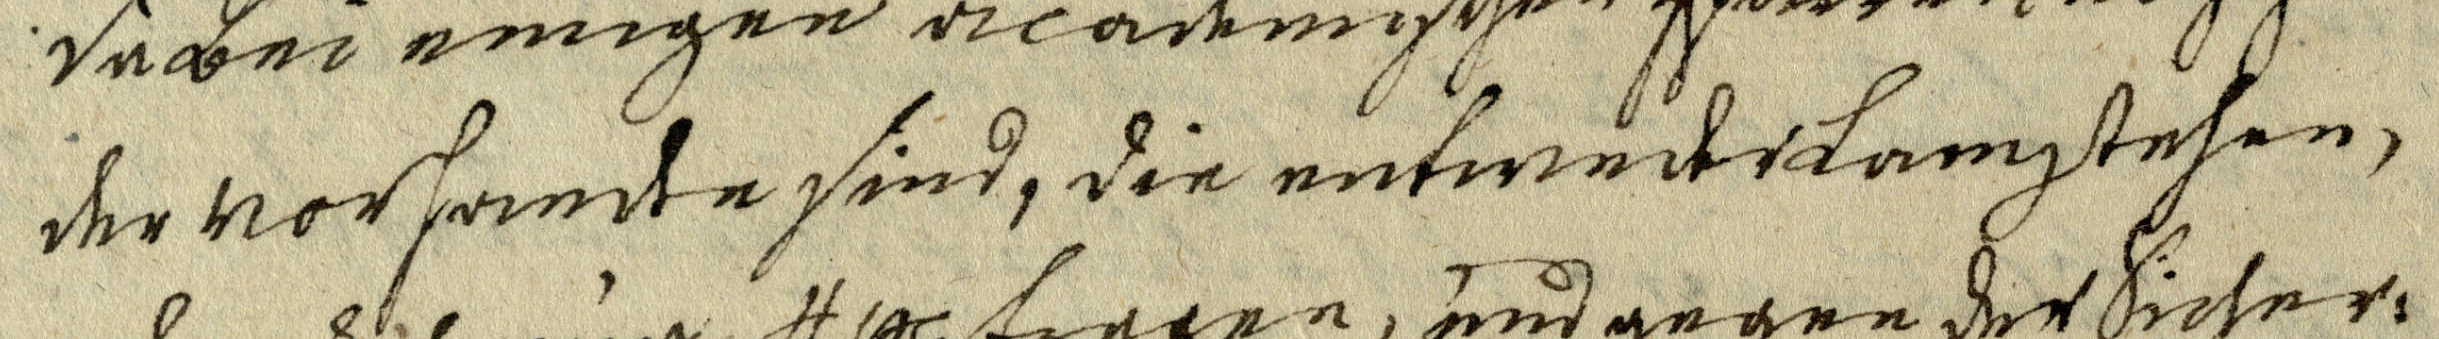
der vorhanden sind, die entweder Lamstehen,
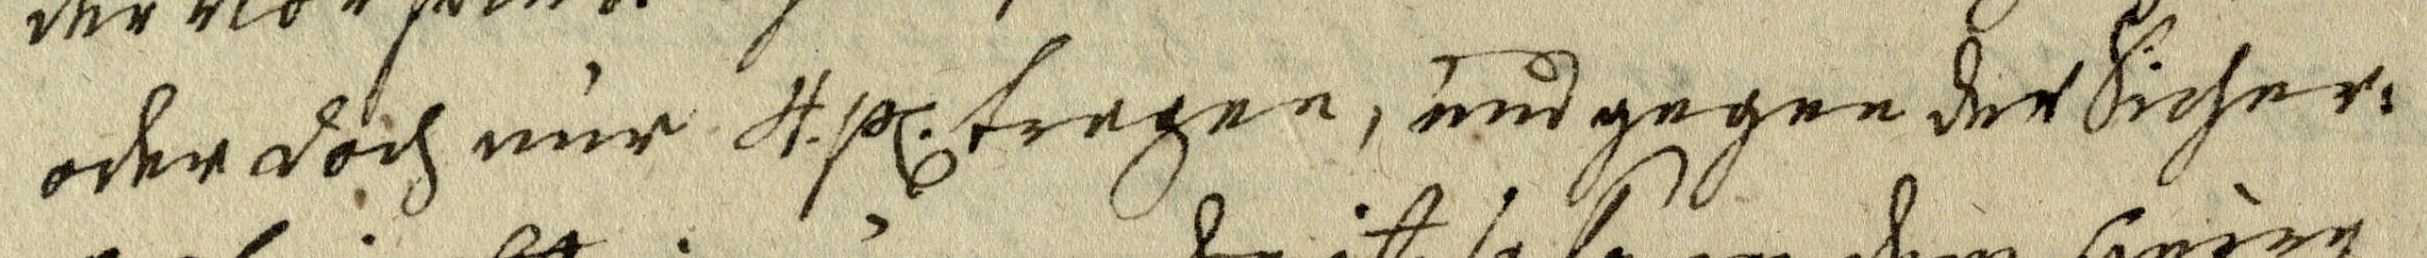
oder doch nur 4 pc. tragen, und gegen der Sicher¬
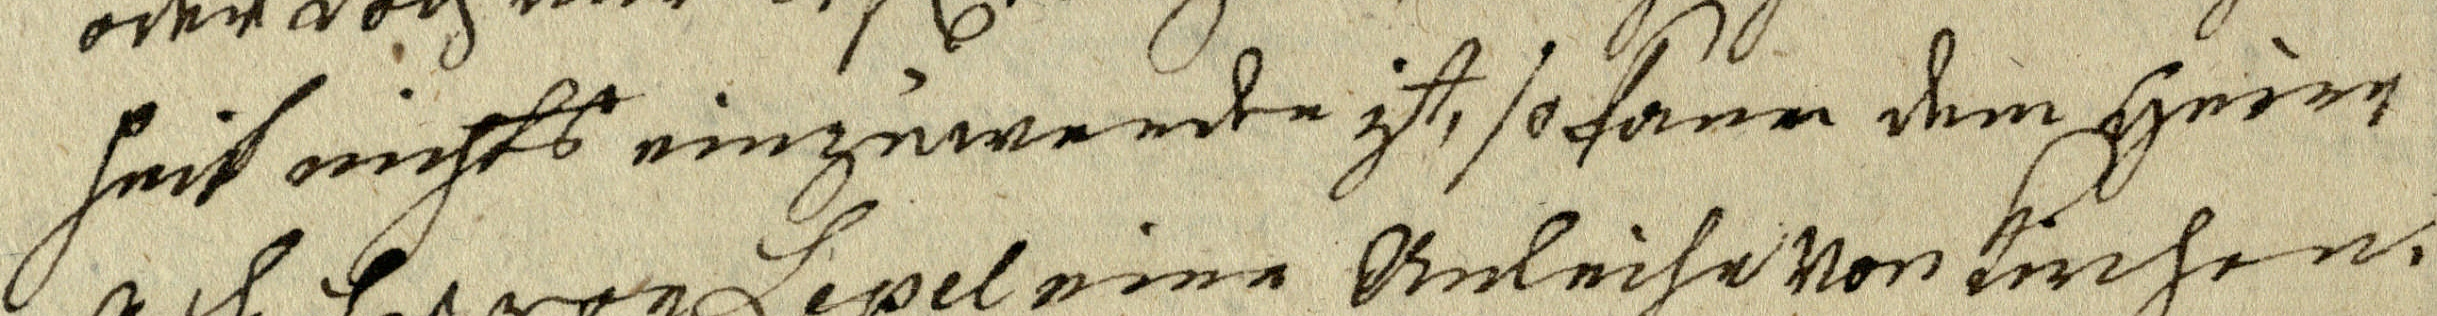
heit nichts einzuwenden ist, so kann dem Herrn
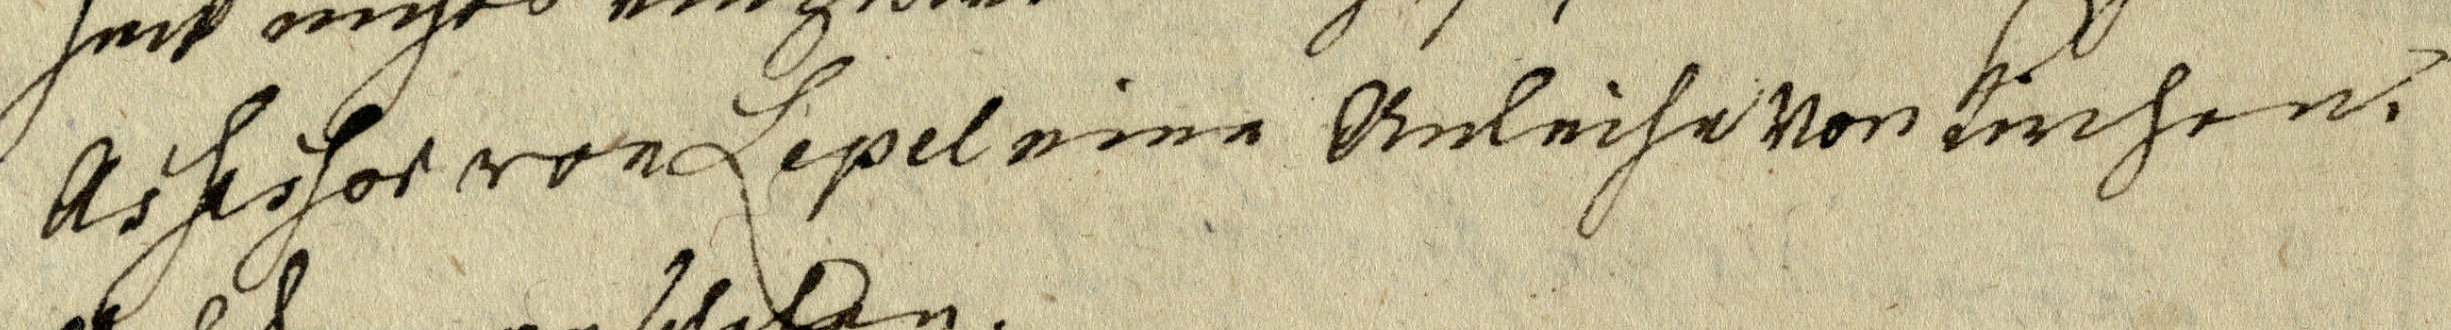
Assessor von Lepel eine Anleihe von Kirchen¬
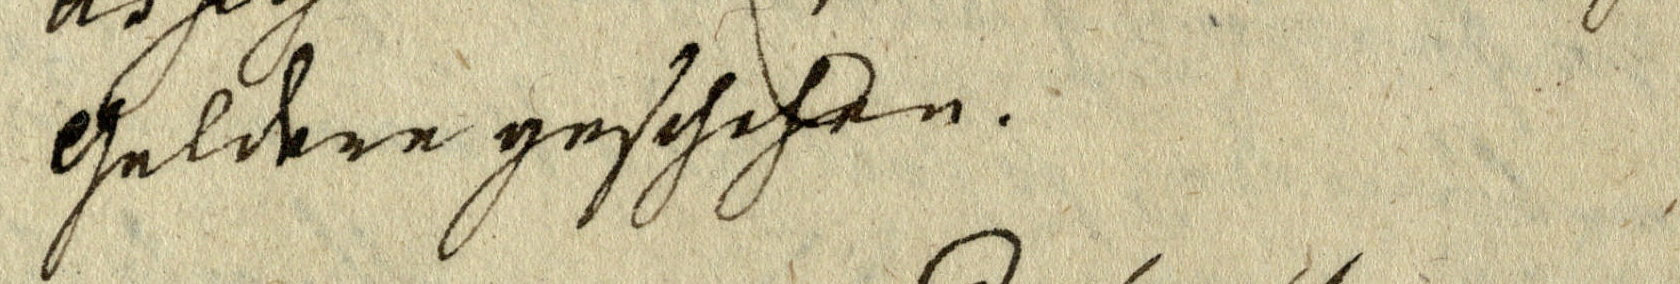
Geldern geschehen.
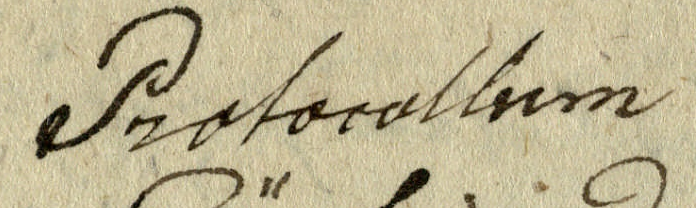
Protocollum
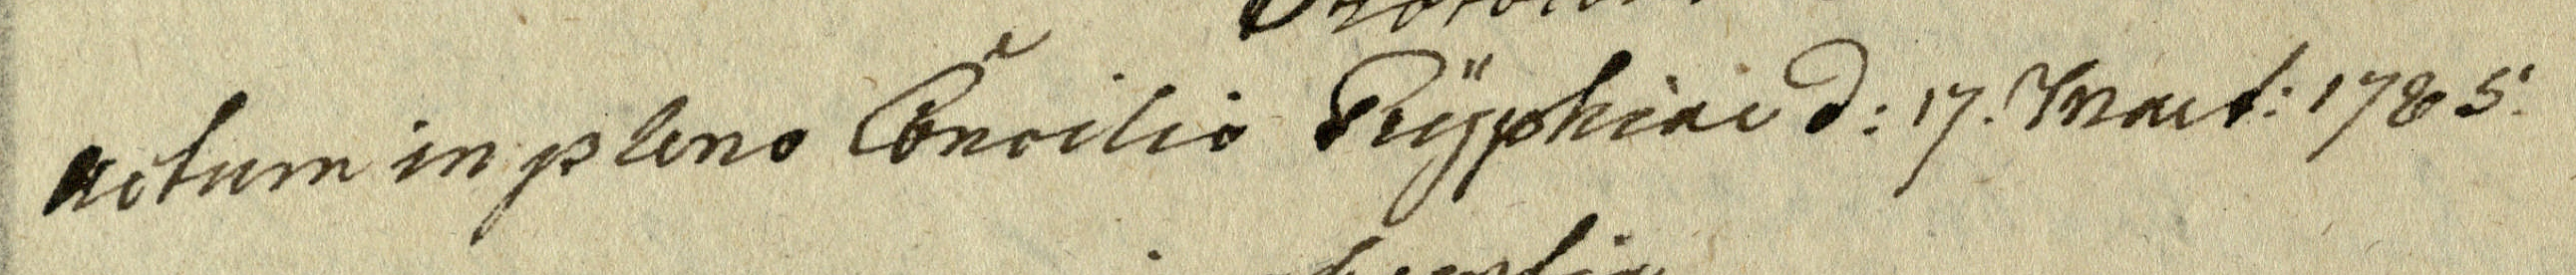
Actum in pleno Concilio Grÿphiae d. 17. Mart. 1785
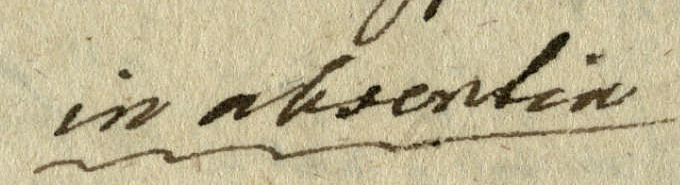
in absentia
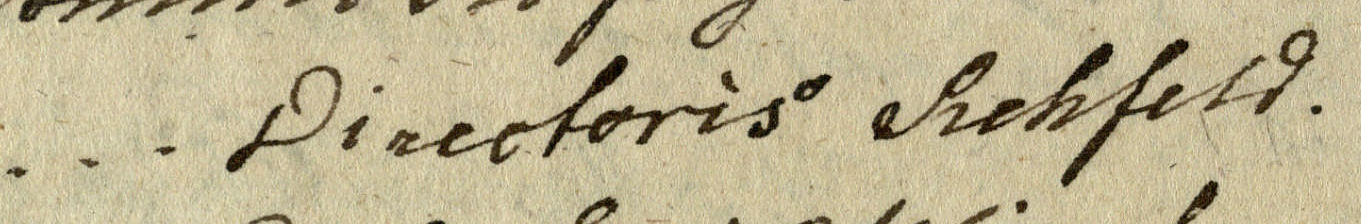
Director Rehfeld.
